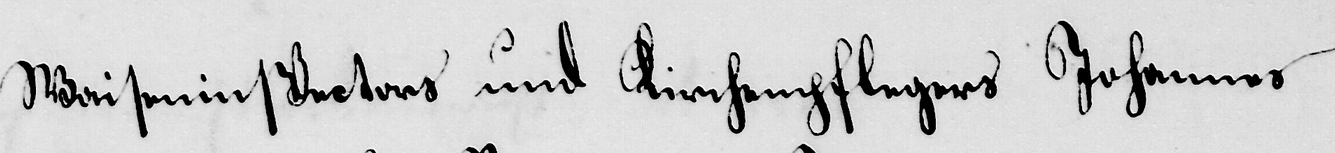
Waiseninspectors und Kirchenpflegers Johannes
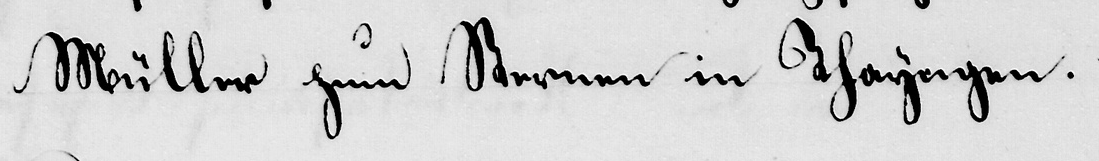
Müller zum Sternen in Thayngen.
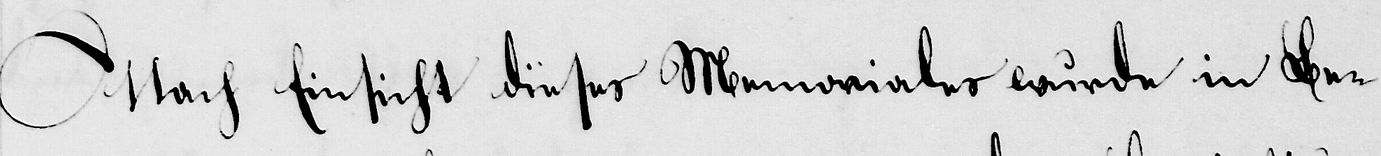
Nach Einsicht dieses Memoriales wurde in Be¬
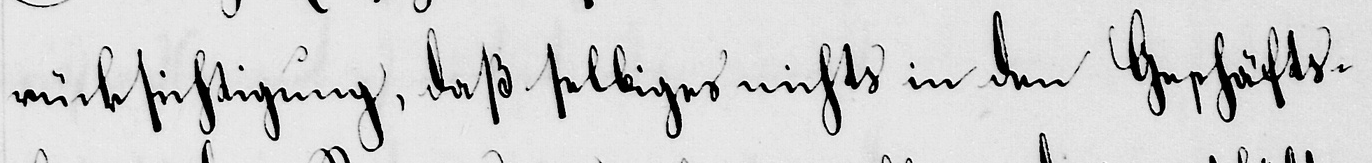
rücksichtigung, daß selbiges nichts in den Geschäfts¬
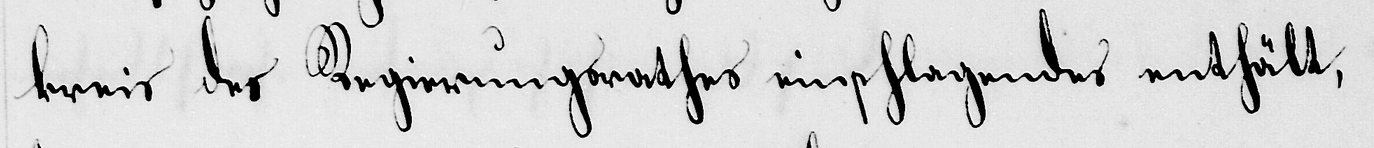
kreis des Regierungsrathes einschlagendes enthält,
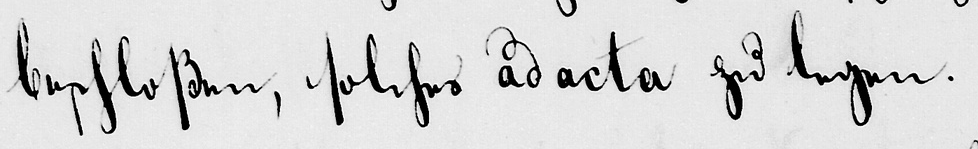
beschloßen, solches ad acta zu legen.
